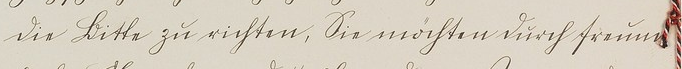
die Bitte zu richten, Sie möchten durch freund-
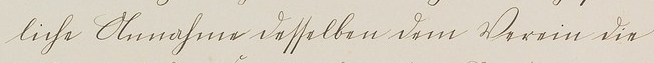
liche Annahme desselben dem Verein die
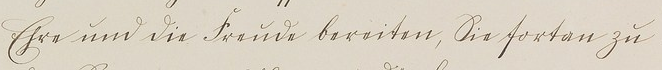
Ehre und die Freude bereiten, Sie fortan zu
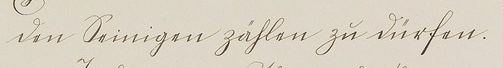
den Seinigen zählen zu dürfen.
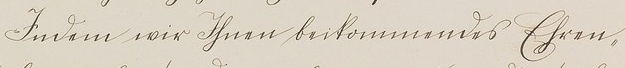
Indem wir Ihnen beikommendes Ehren-
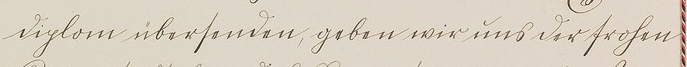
diplom übersenden, geben wir uns der frohen
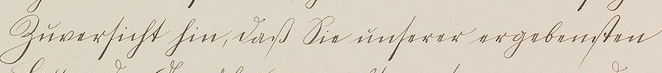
Zuversicht hin, daß Sie unserer ergebensten
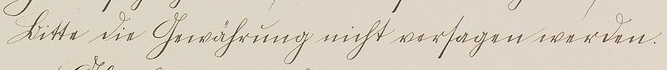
Bitte die Gewährung nicht versagen werden.
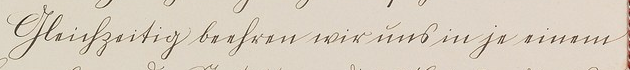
Gleichzeitig beehren wir uns in je einem
